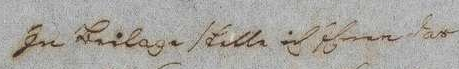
In Beilage stelle ich Ihnen das
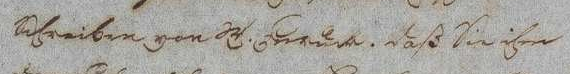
Schreiben von Sch. zurück. Daß Sie ihm
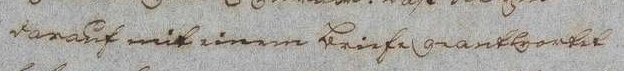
darauf mit einem Briefe geantwortet
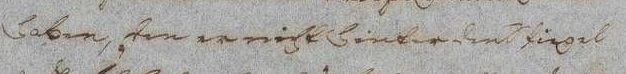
haben, «den er nicht hinter den Spiegel
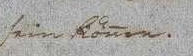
sein können.
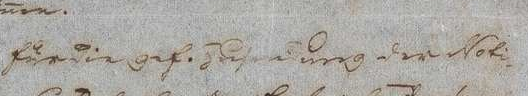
Für die gef. Zusendung der Noti-
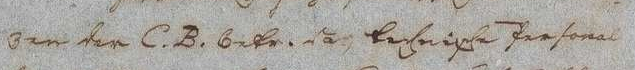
zen der C.B. betr. das technische Personal
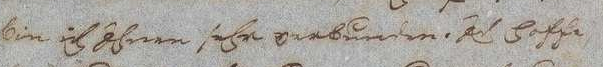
bin ich Ihnen sehr verbunden. Ich hoffe,
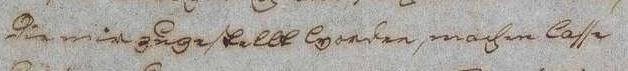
die mir zugestellt worden, machen lasse
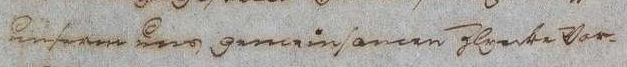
unserm uns gemeinsamen Zwecke Vor-
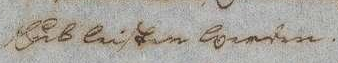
schub leisten werden.
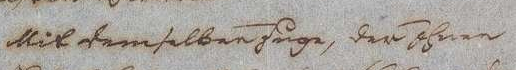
Mit demselben Zuge, der Ihnen
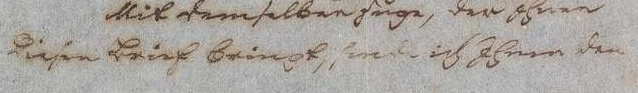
diesen Brief bringt, sende ich Ihnen den
